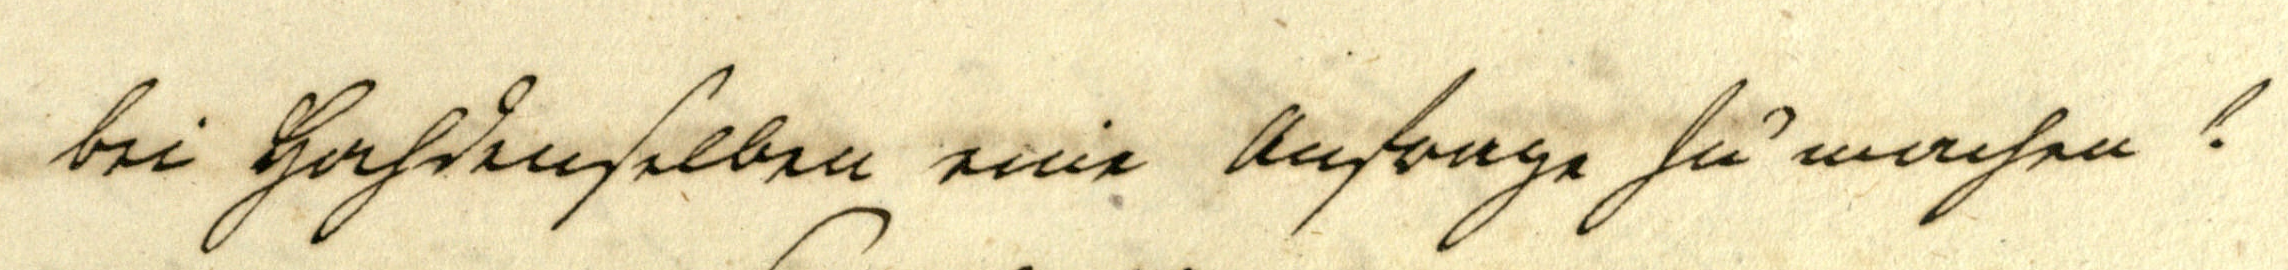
bei Hochdenselben eine Anfrage zu machen?
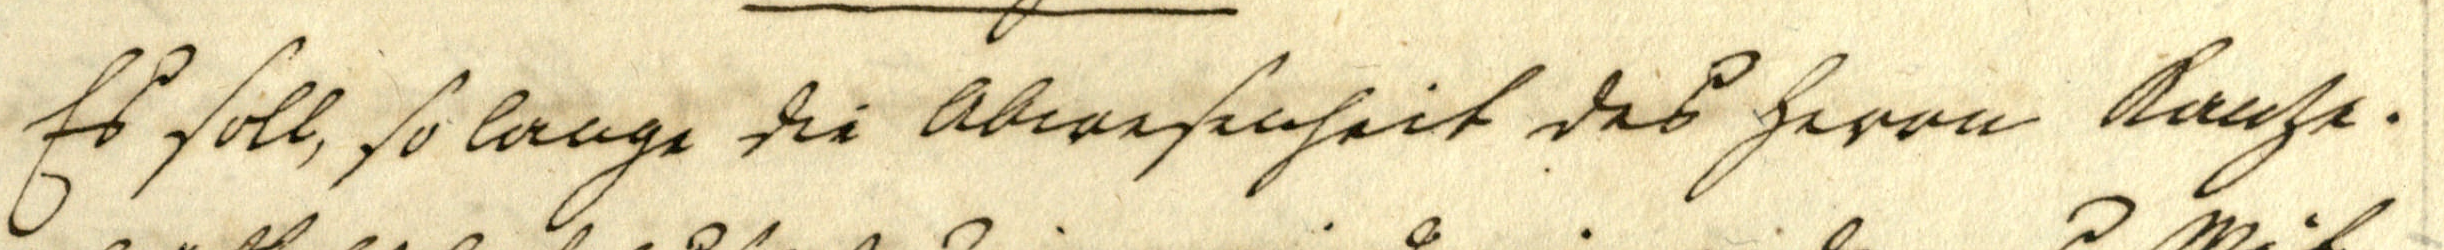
Es soll, so lange die Abwesenheit des Herrn Kanze¬
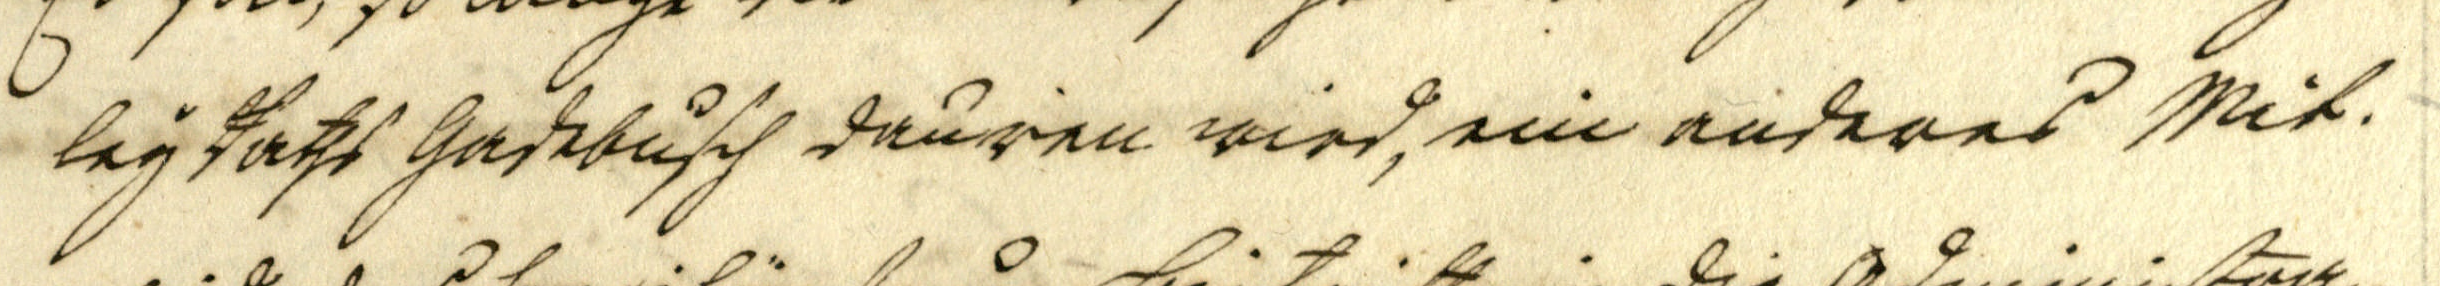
leÿ Raths Gadebusch dauren wird, ein anderes Mit¬
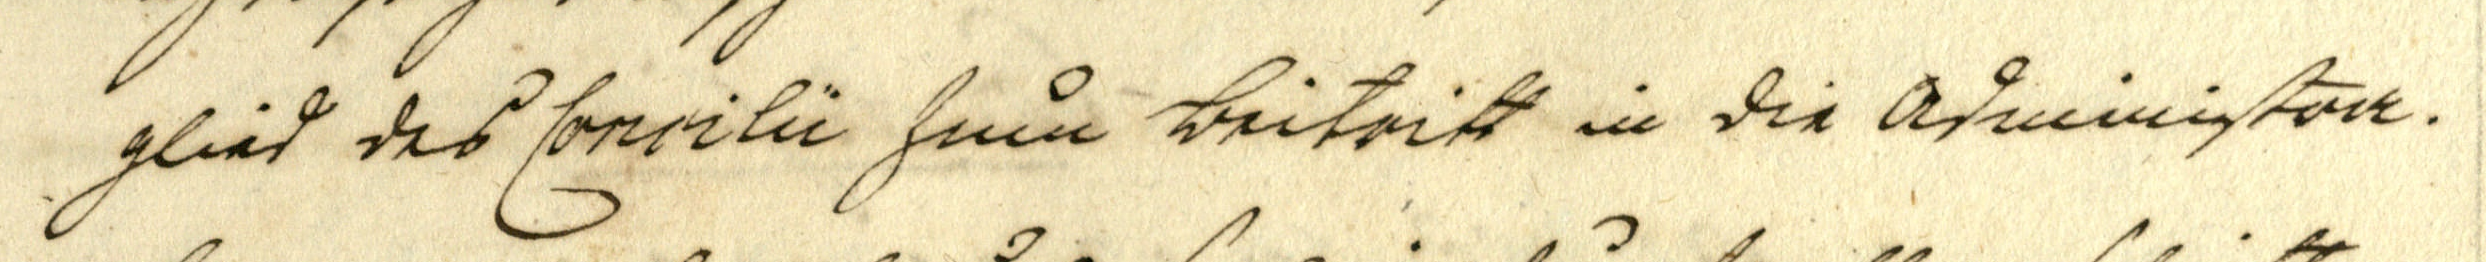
glied des Concilii zum Beitritt in die Administra¬
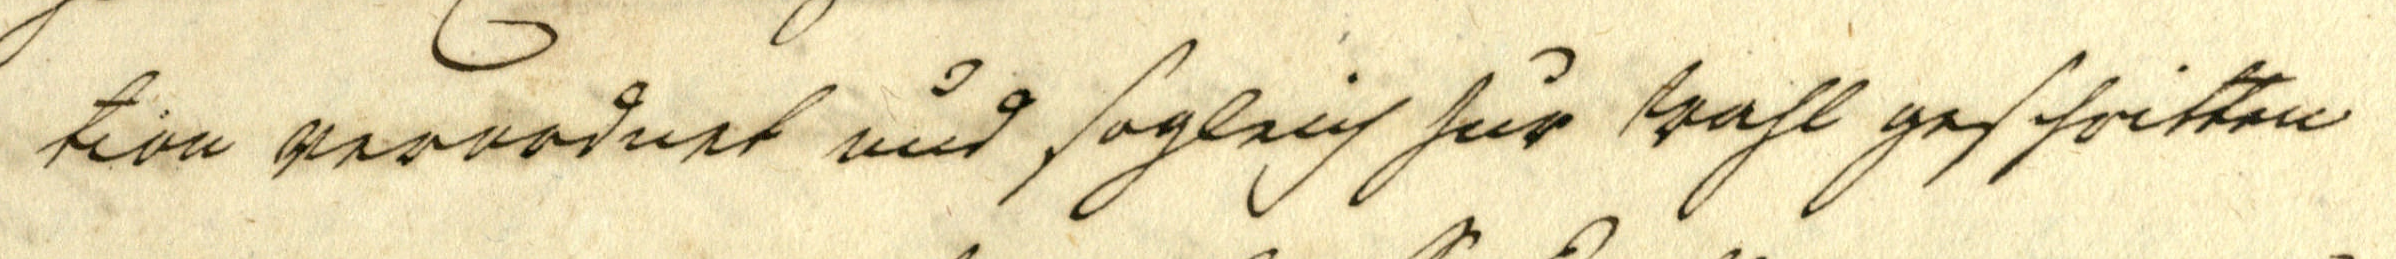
tion verordnet und sogleich zur Wahl geschritten
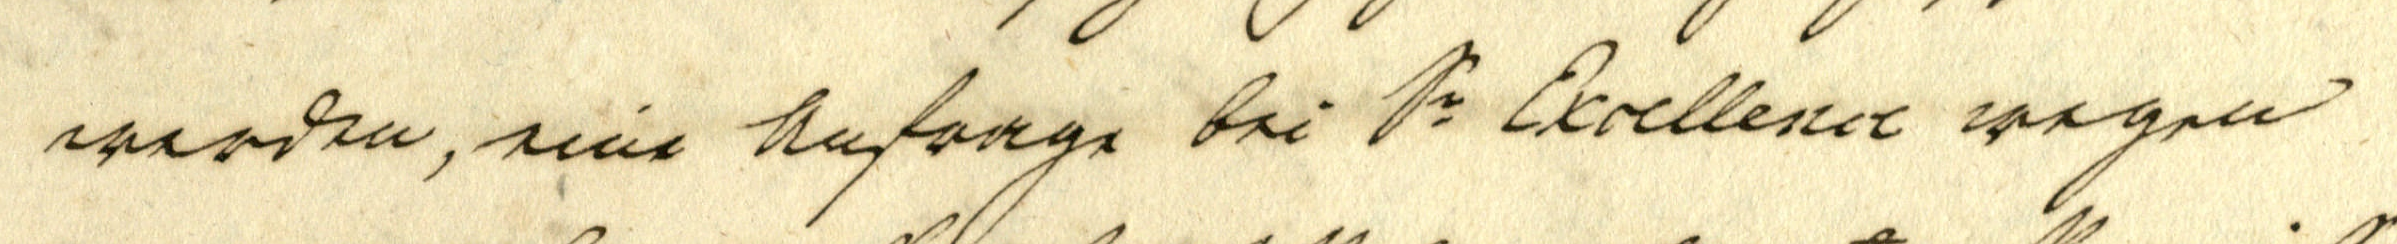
werden, eine Anfrage bei Sr Excellence wegen
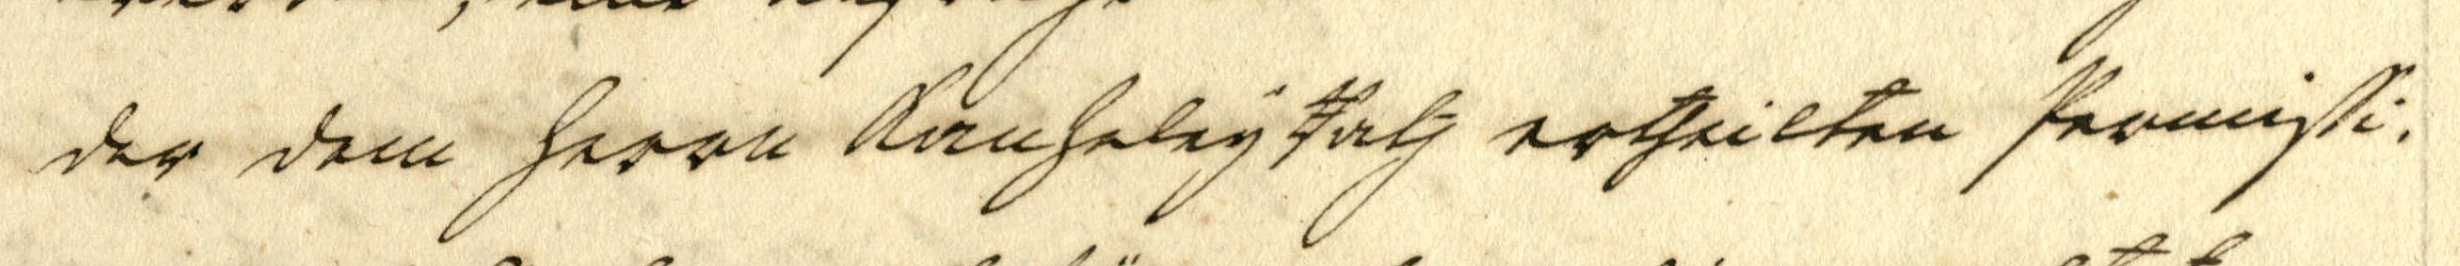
der dem Herrn Kanzeleÿ Rath ertheilten Permissi¬
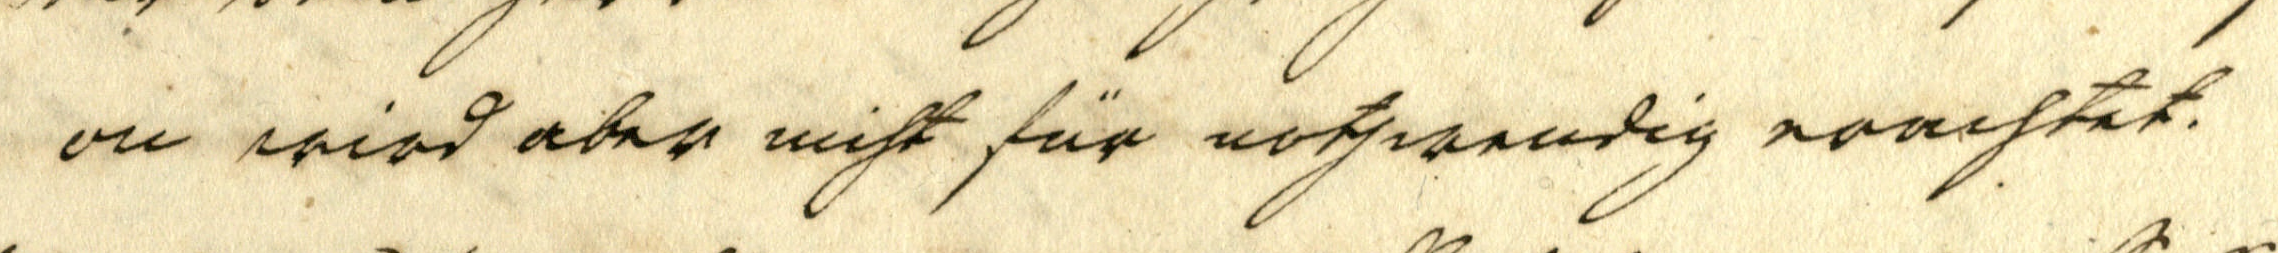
on wird aber nicht für nothwendig erachtet.
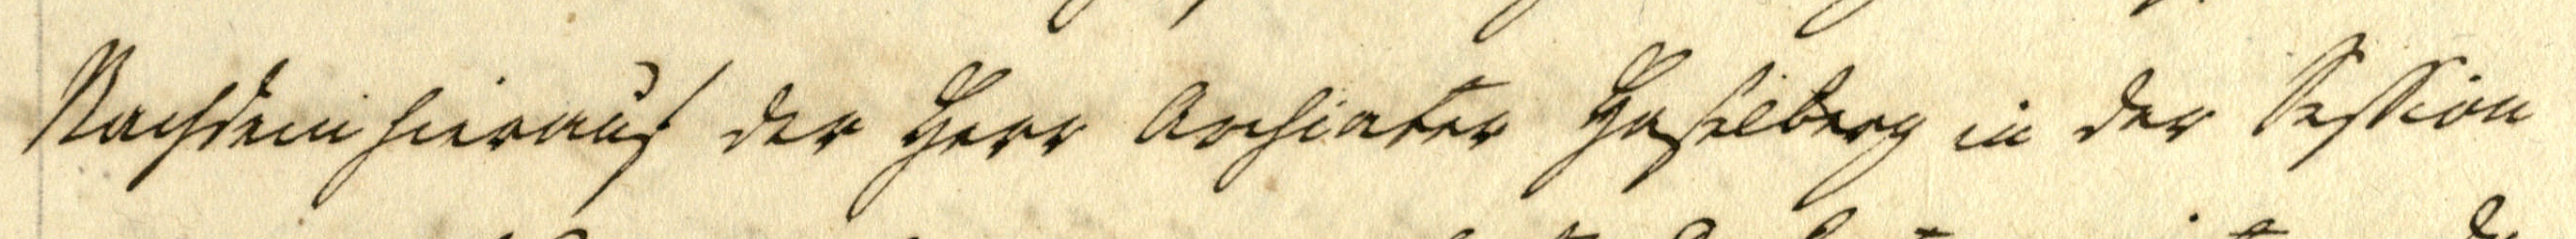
Nachdem hierauf der Herr Archiater Haselberg in der Session
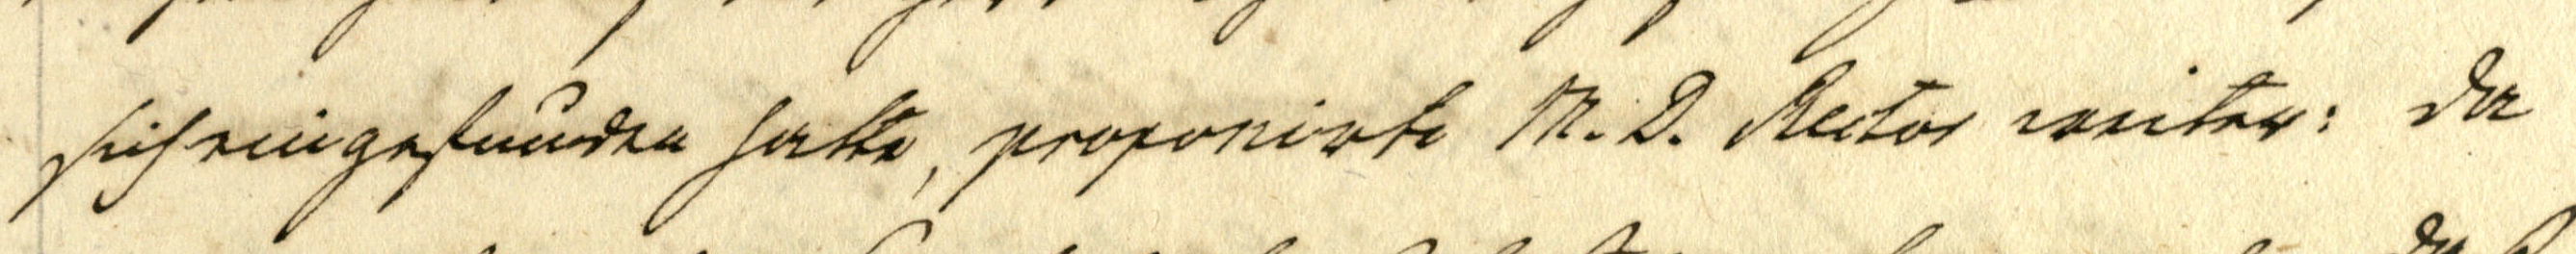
sich eingefunden hatte, proponirte M. D. Rector weiter: da
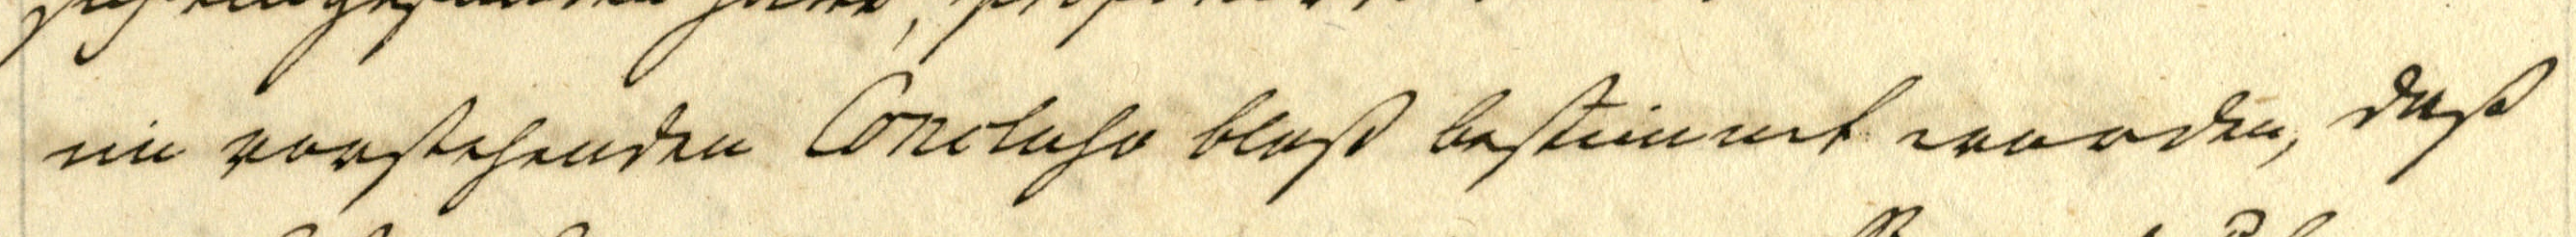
im vorstehenden Concluso bloß bestimmt worden, daß
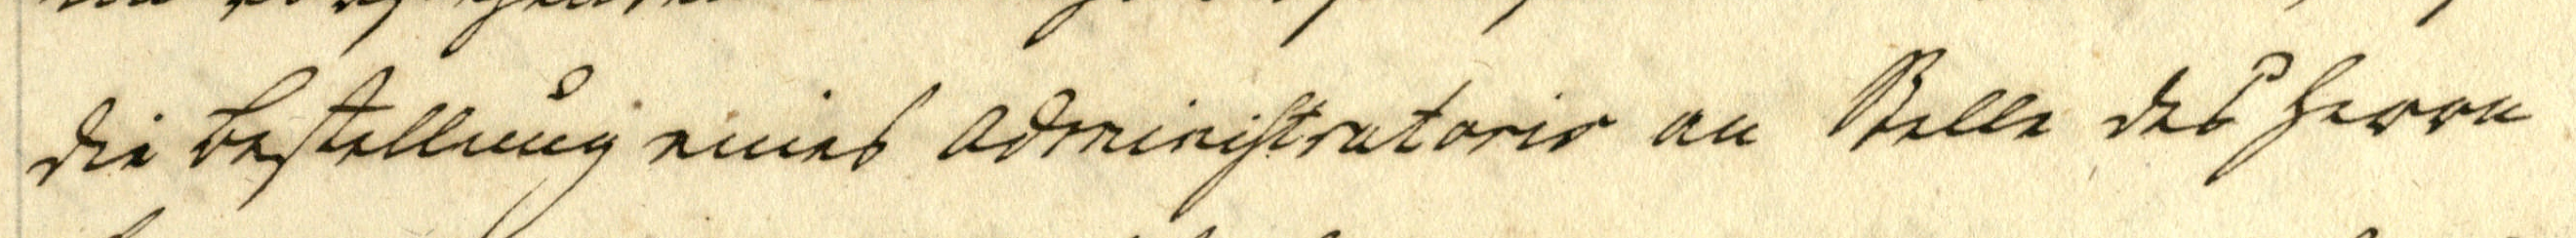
die Bestellung eines Administratoris an Stelle des Herrn
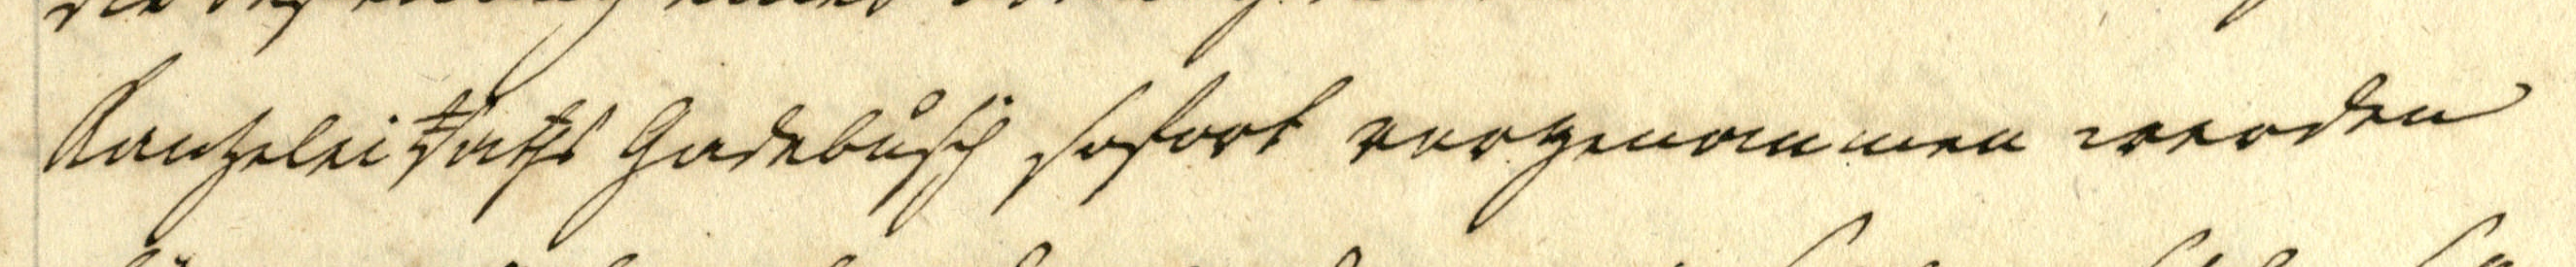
Kanzelei Raths Gadebusch sofort vorgenommen werden
